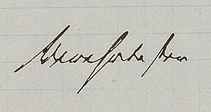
Verehrtester
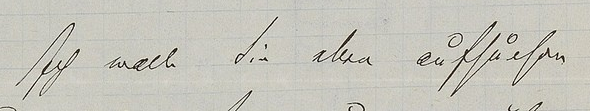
Ich wolle Sie eben aufsuchen
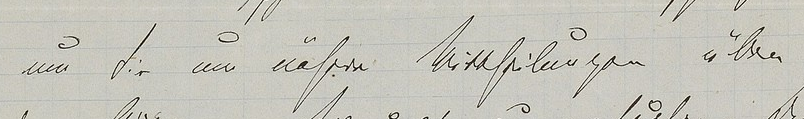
um Sie um nähere Mitteilungen über
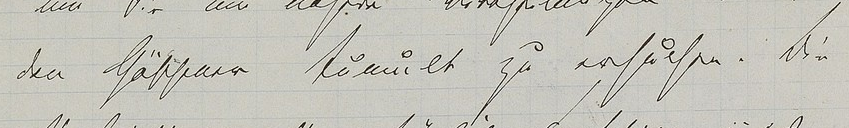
den Göschener Tumult zu ersuchen. Die
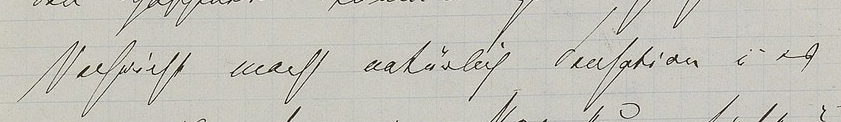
Nachricht macht natürlich Sensation u. es
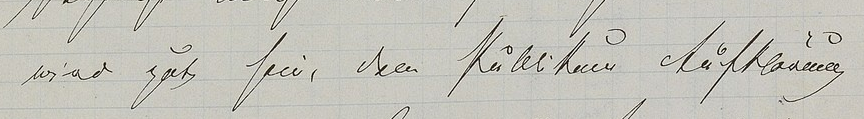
wird gut sein, dem Publikum Aufklärung
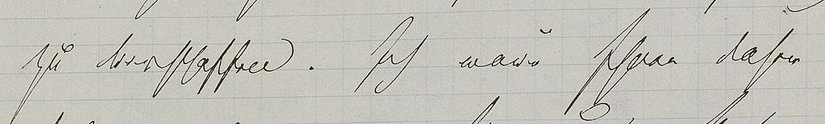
zu verschaffen. Ich wäre Ihnen daher
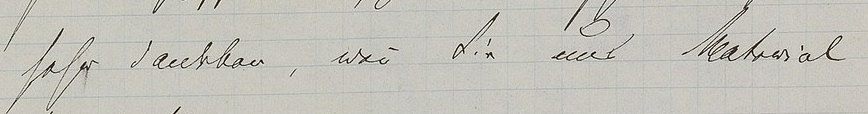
sehr dankbar, wenn Sie uns Material
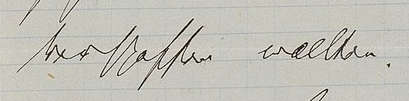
verschaffen wollten.
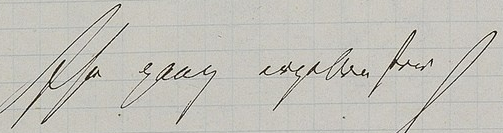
Ihr ganz ergebenster
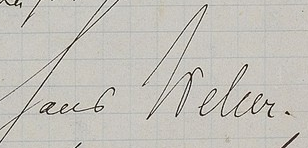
Hans Weber.
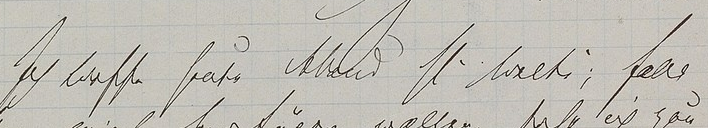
Ich treffe heute Abend H. Welti; falls
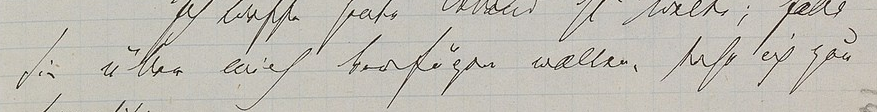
Sie über mich verfügen wollen, stehe ich zur
